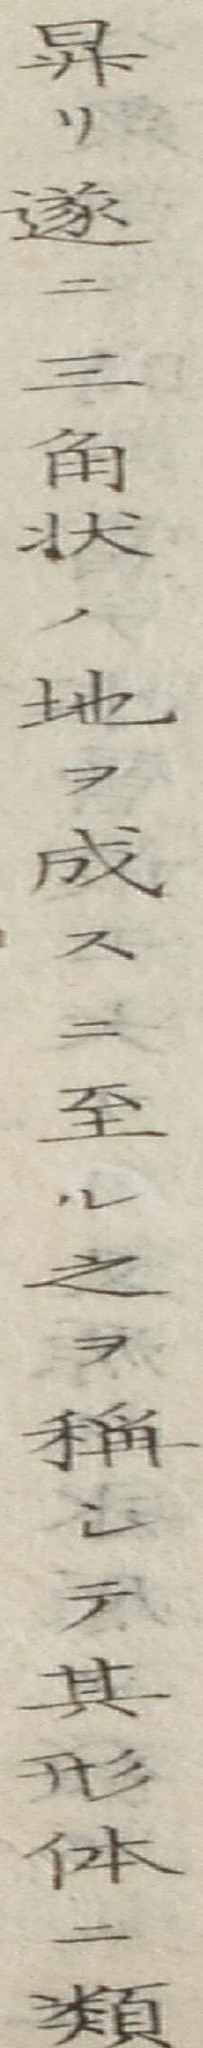昇リ遂ニ三角状ノ地ヲ成スニ至ル之ヲ称シテ其形体ニ類
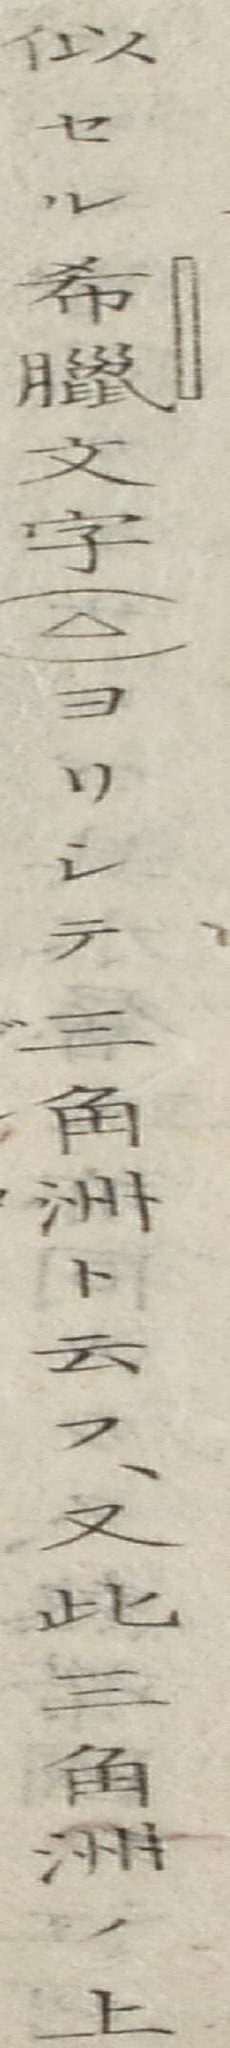似セル希臘文字ヨリシテ三角洲ト云フ、又此三角洲ノ上
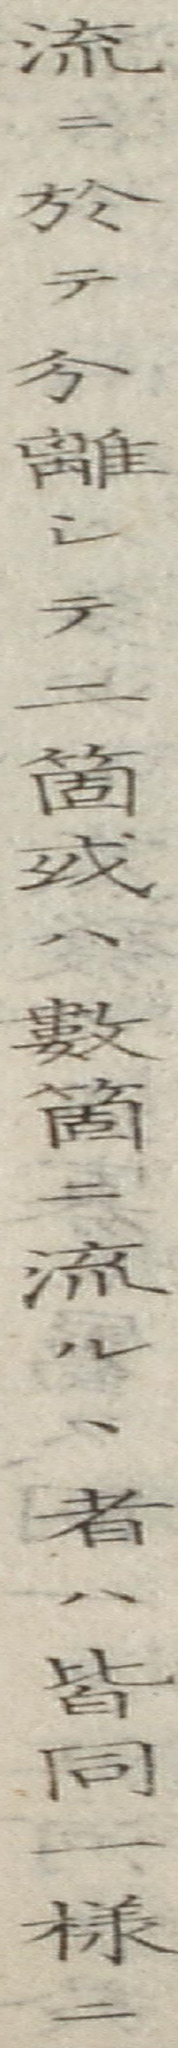流ニ於テ分離シテ二箇或ハ数箇ニ流ルヽ者ハ皆同一様ニ
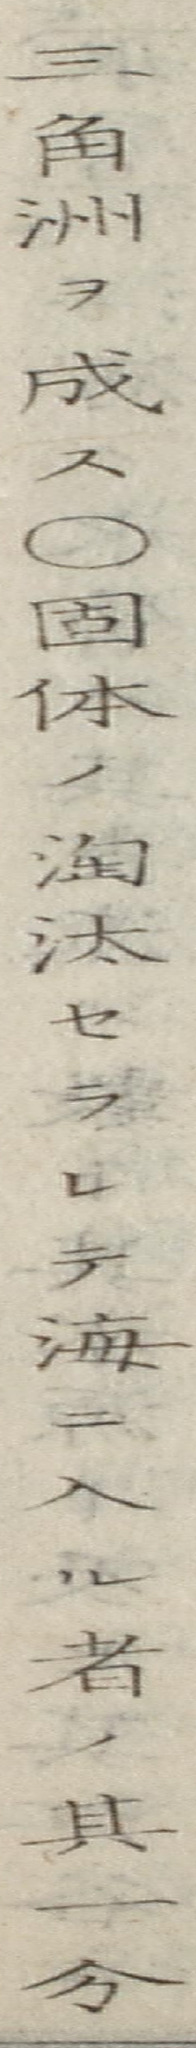三角洲ヲ成ス〇個体ノ淘汰セラレテ海ニ入ル者ノ其一分
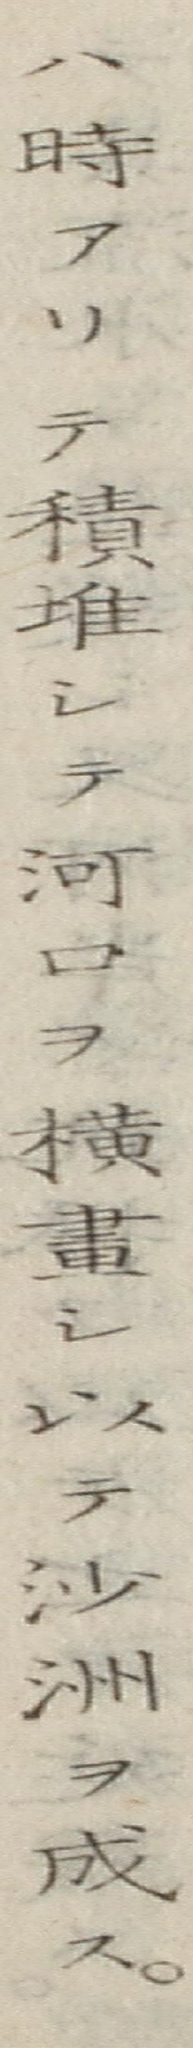ハ時アリテ積堆シテ河口ヲ横畫シ以テ沙洲ヲ成ス。
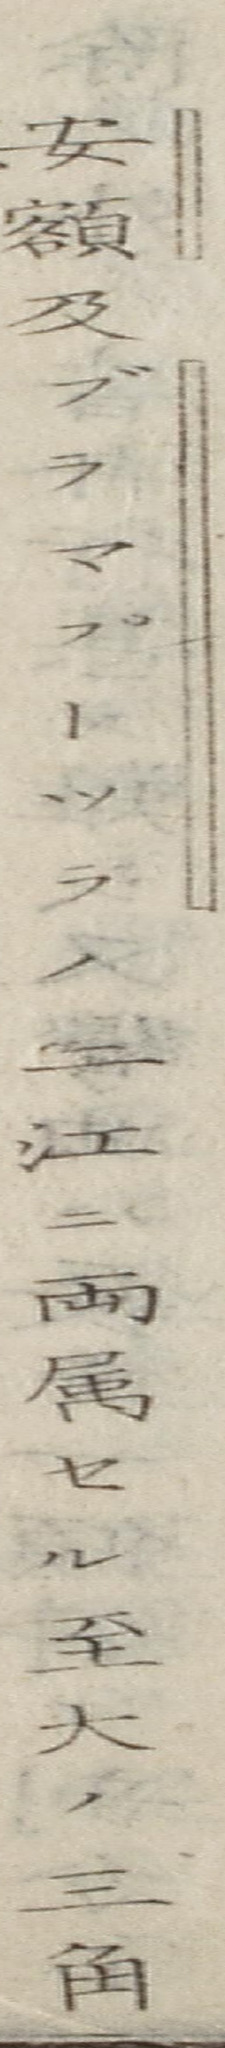安額及ブラマプーツラノ二江ニ両属セル至大ノ三角
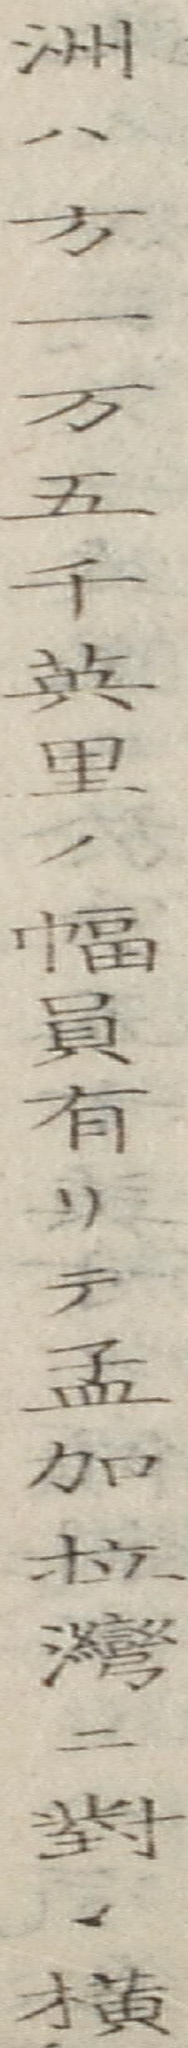洲ハ方一万五千英里ノ幅員有リテ孟加拉湾ニ対シ横
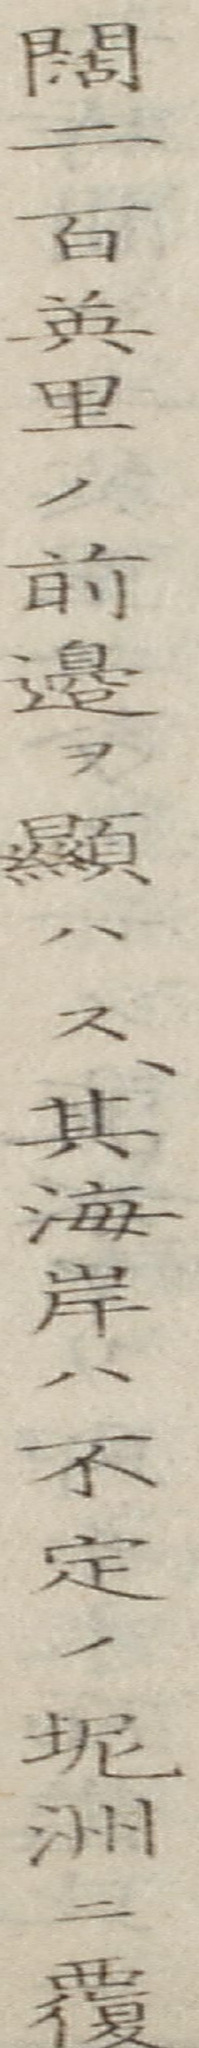闊ニ百英里ノ前辺ヲ顕ハス、其海岸ハ不定ノ泥洲ニ覆
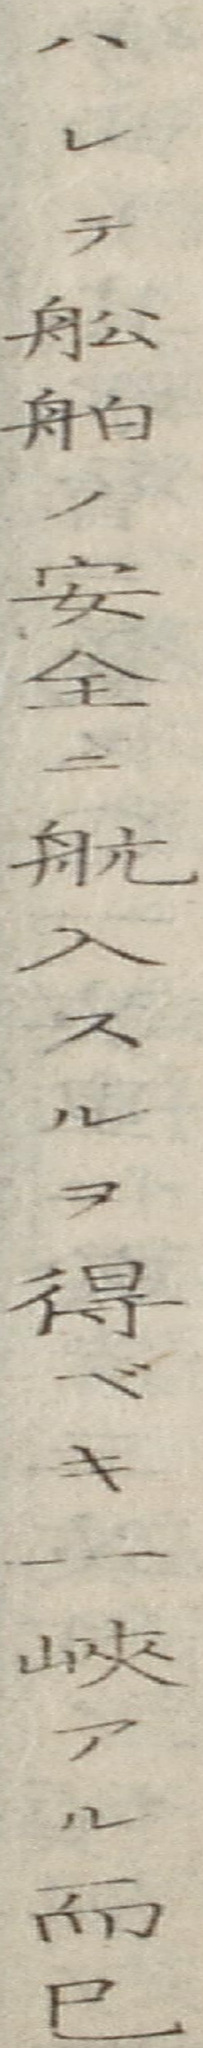ハレテ舩舶ノ安全ニ航入スルヲ得ベキ一峡アル而巳
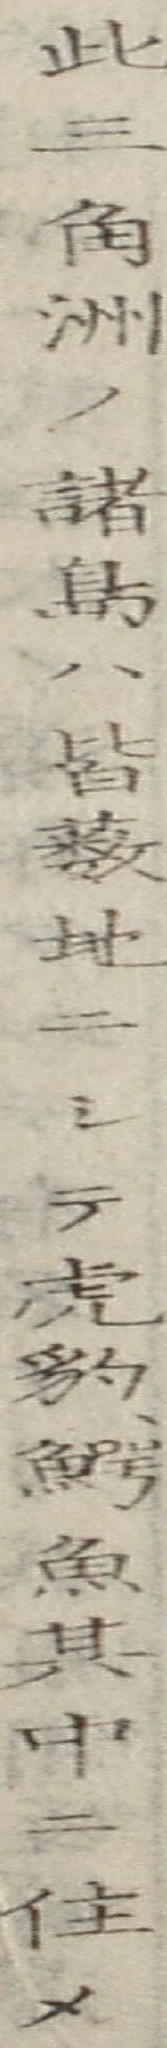此三角州ノ諸島ハ皆薮地ニシテ虎豹、鰐魚其中ニ住メ
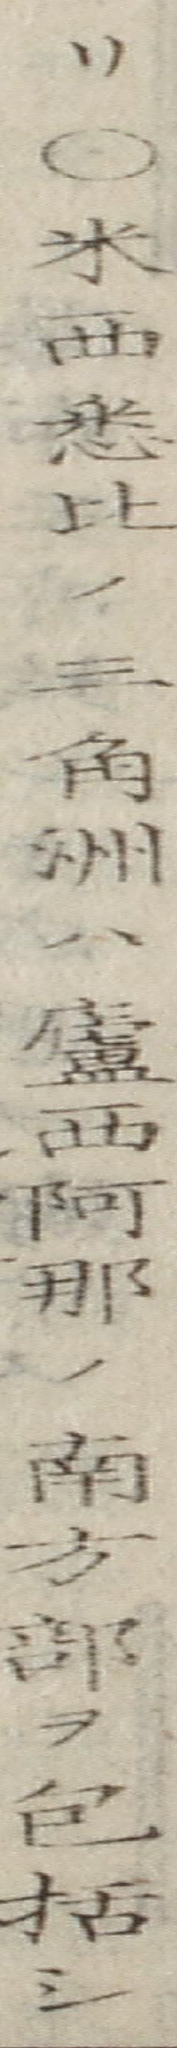リ〇米西悉比ノ三角洲ハ盧西阿那ノ南方部ヲ包括シ
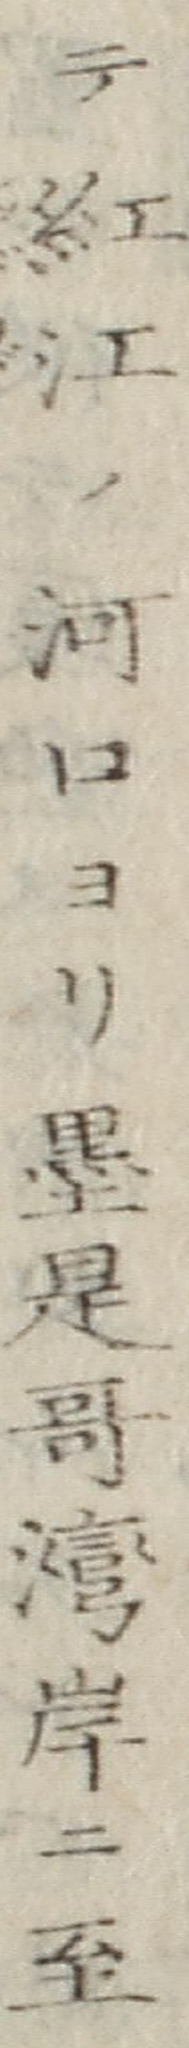テ紅江ノ河口ヨリ墨是哥湾岸ニ至
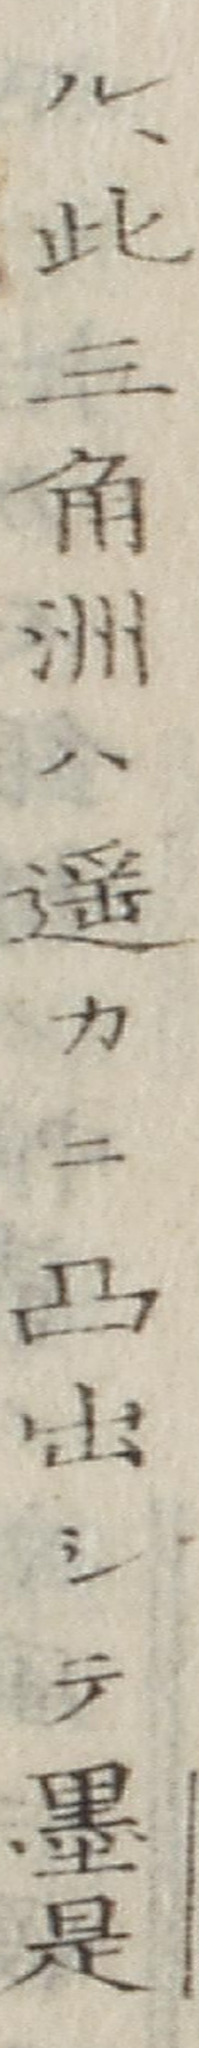ル、此三角州ハ遙カニ凸出シテ墨是
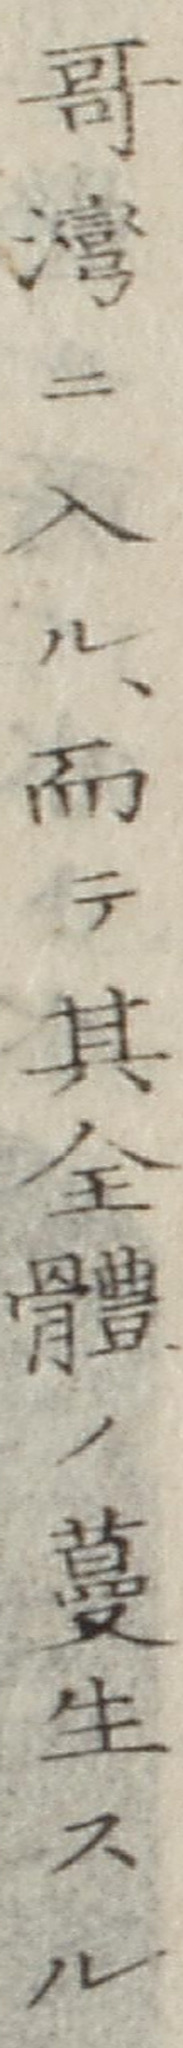哥湾ニ入ル、而テ其全体ノ蔓生スル
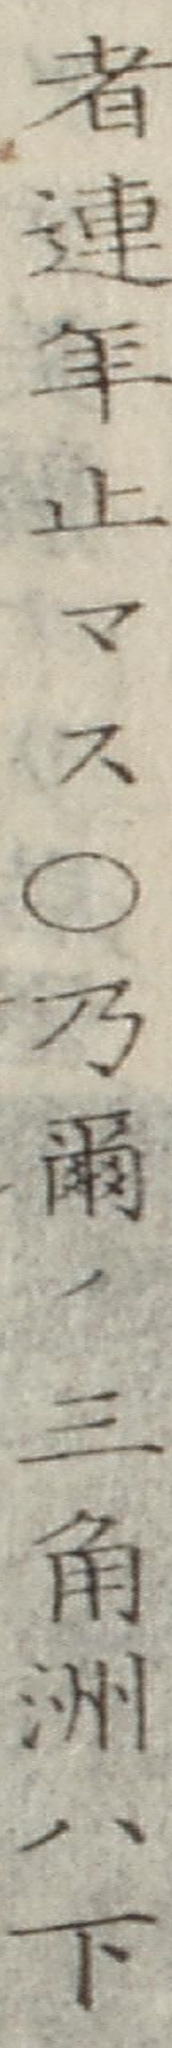者連年止マス〇及爾ノ三角洲ハ下
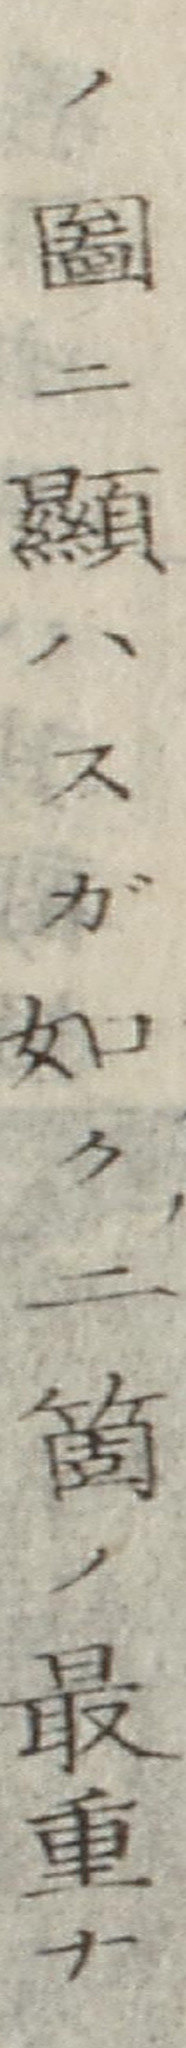ノ図ニ顕ハスガ如ク二箇ノ最重ナ
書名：地形論　巻二
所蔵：東京大学地震研究所図書室 Earthquake Research Institute Library, The University of Tokyo, JAPAN
